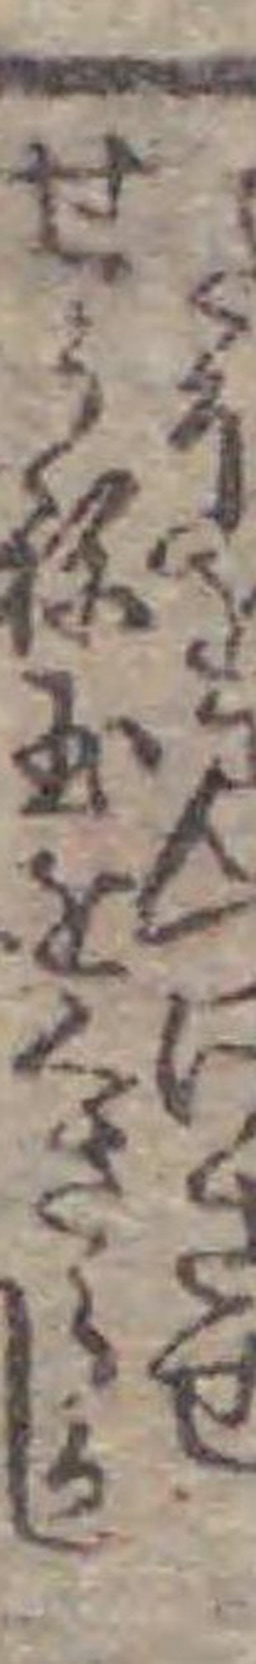せうね玉をくさらかし
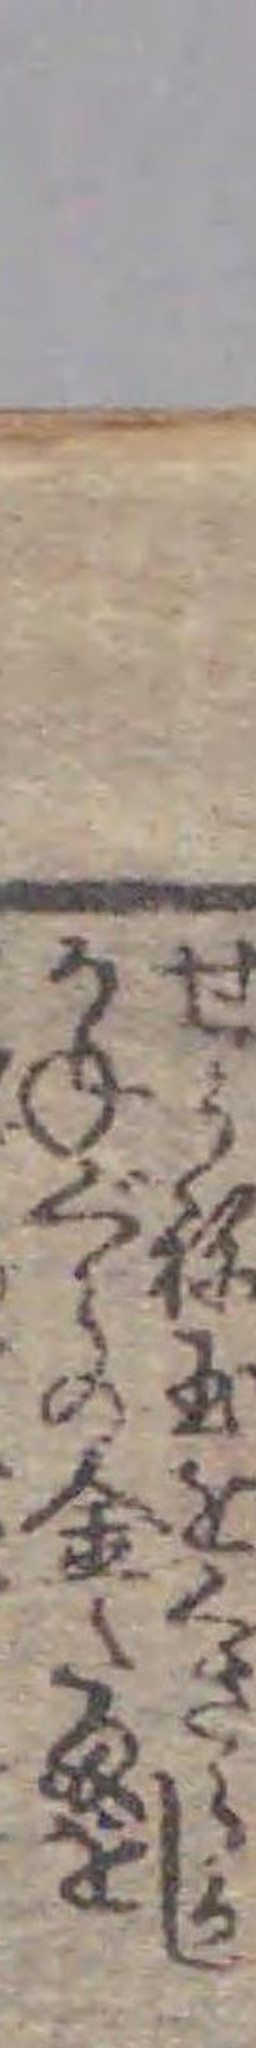かねぐらの金たまを
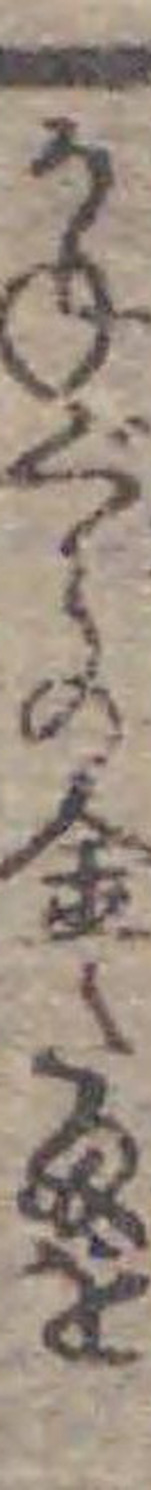かねぐらの金たまを
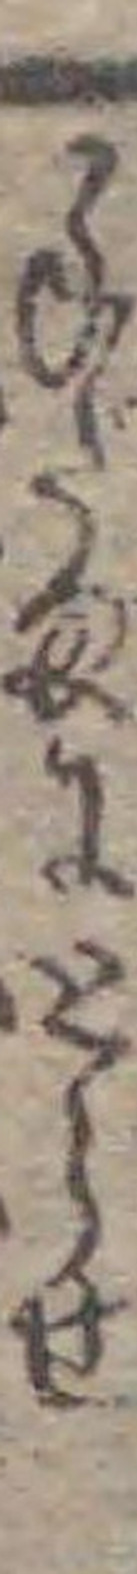手だまにとらせ
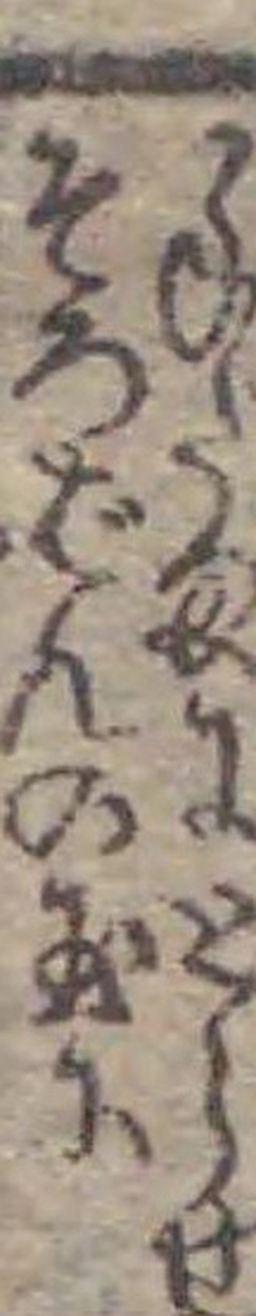そろばんの玉に
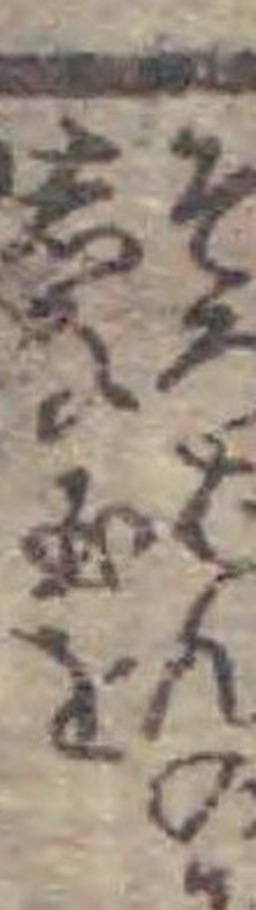しな玉を
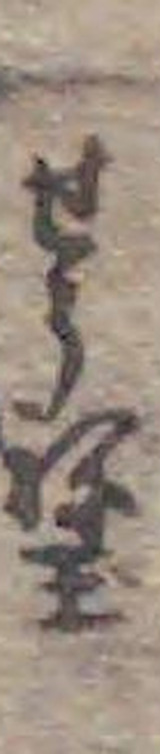せうね玉
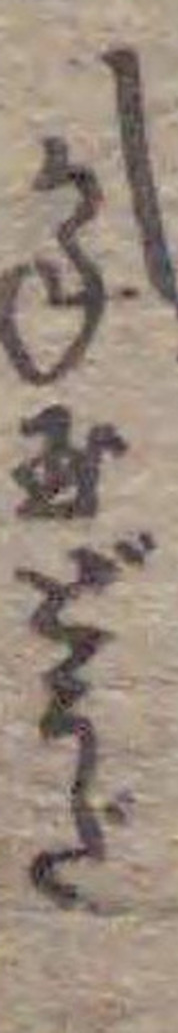〽かね玉どうだ
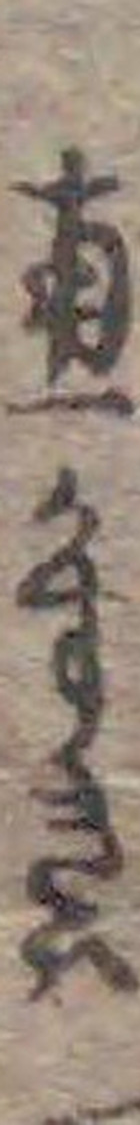南一かすきは
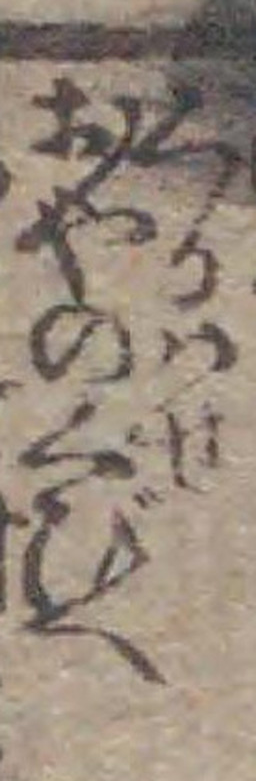おやのくびへ
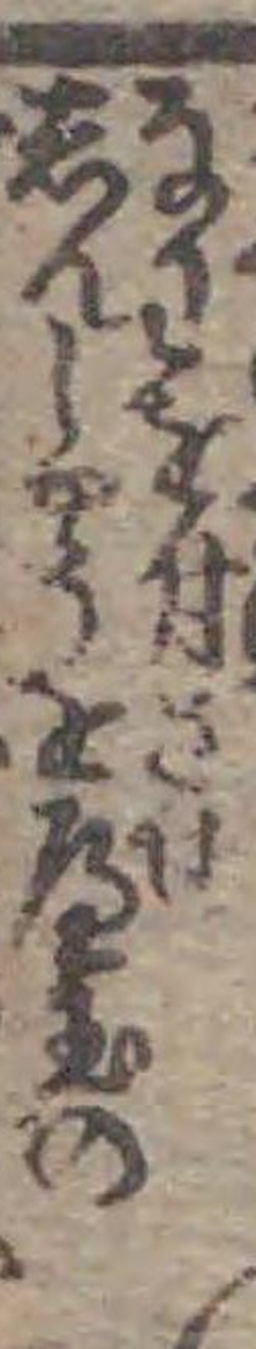しんしやうをへ玉の
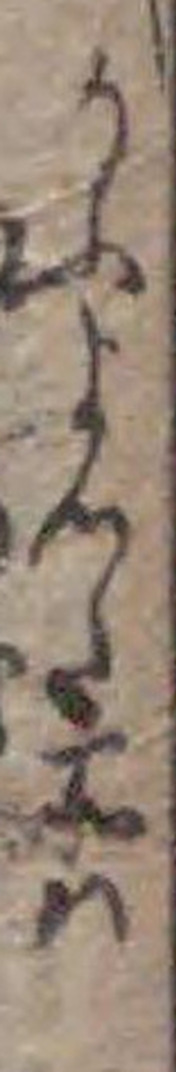〽かふよつた所は
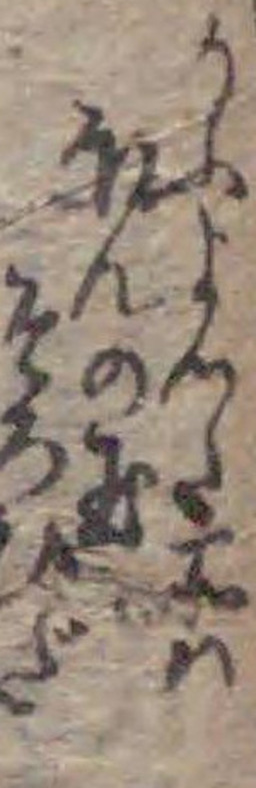そろひだ
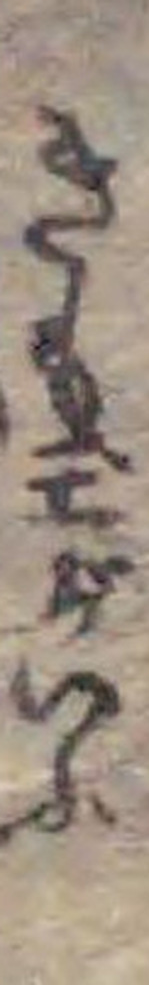きも玉がいふ
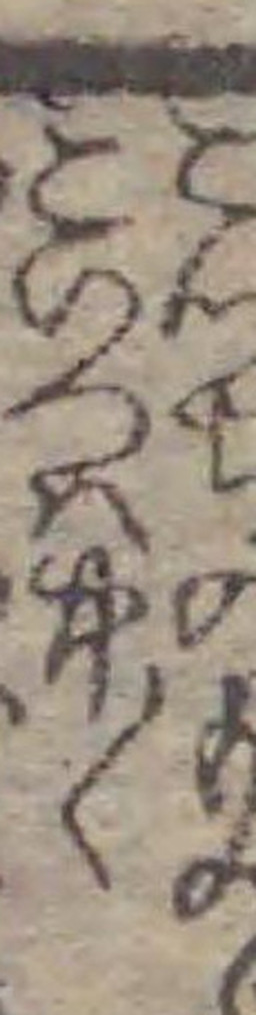こいつは中〳〵
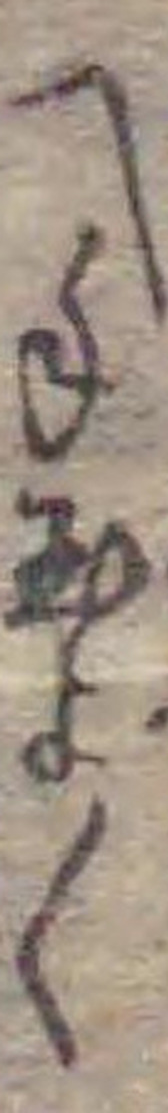〽手玉よ〳〵
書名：四遍搨心学草帋 : 3巻
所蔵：国立国会図書館 National Diet Library, JAPAN
